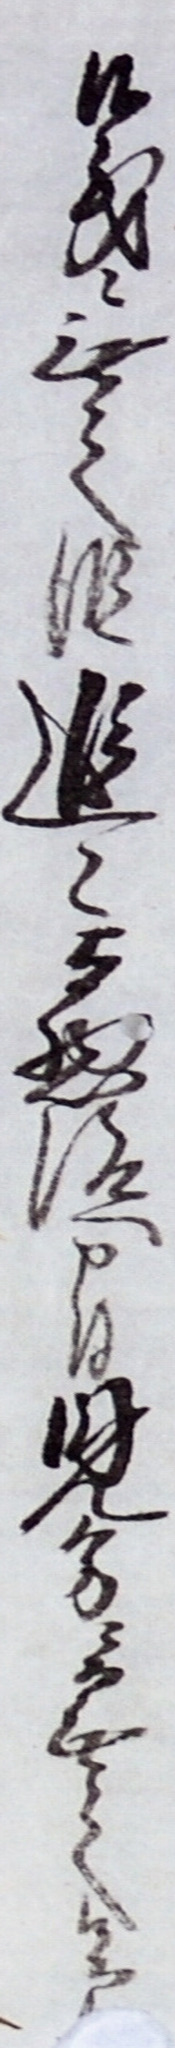候義ニ無之段追々と惣治へ申付見分ニ而無之候而成之
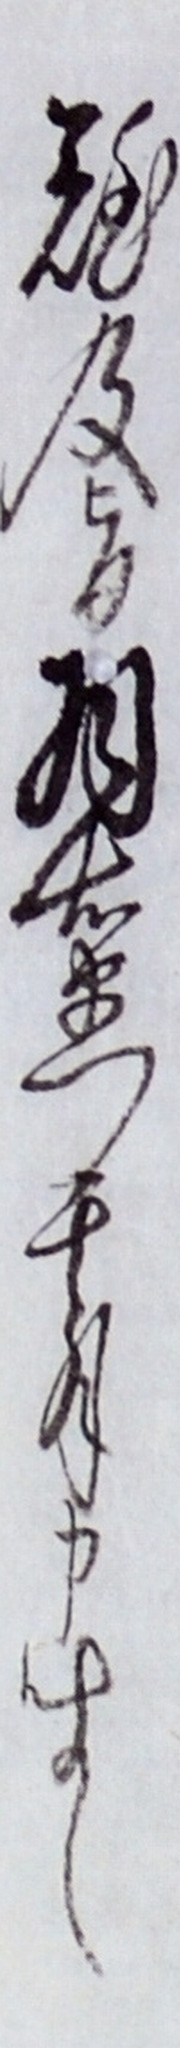難及旨羽右衛門其外ヵ申聞候
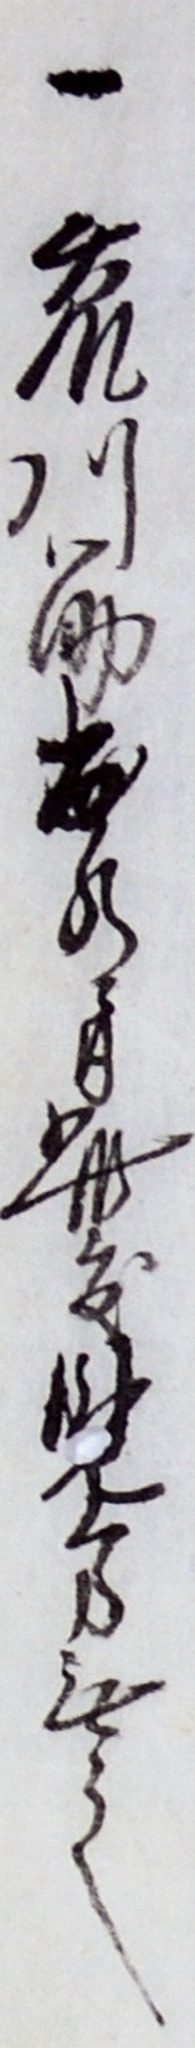一荒川筋出水ニ付此度見分無之

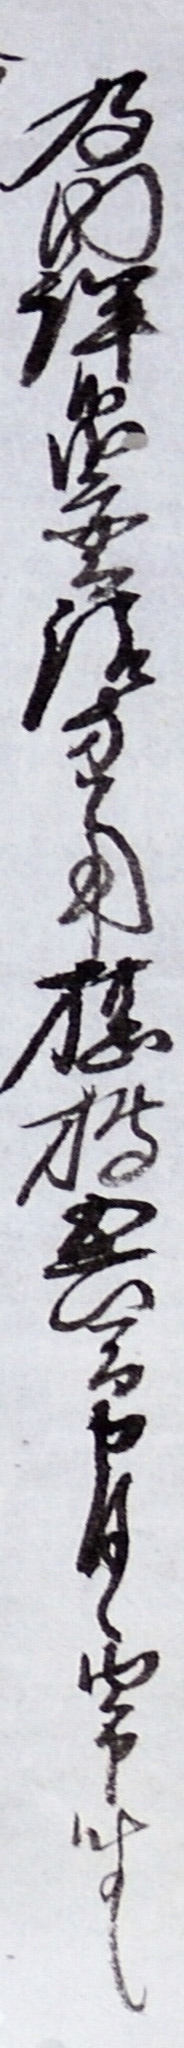為内訳候間御普請方と用樵を以旨申付候由申聞候
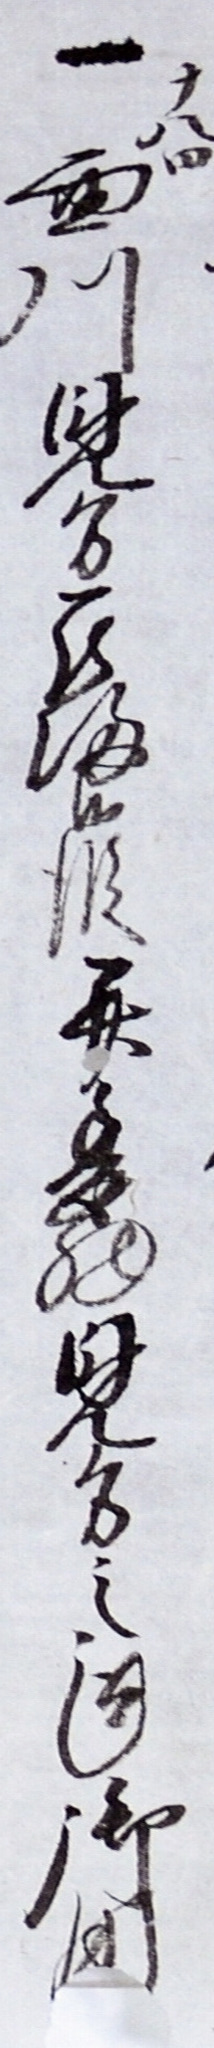一西川見方罷帰候段并手筋物見分之趣御用達
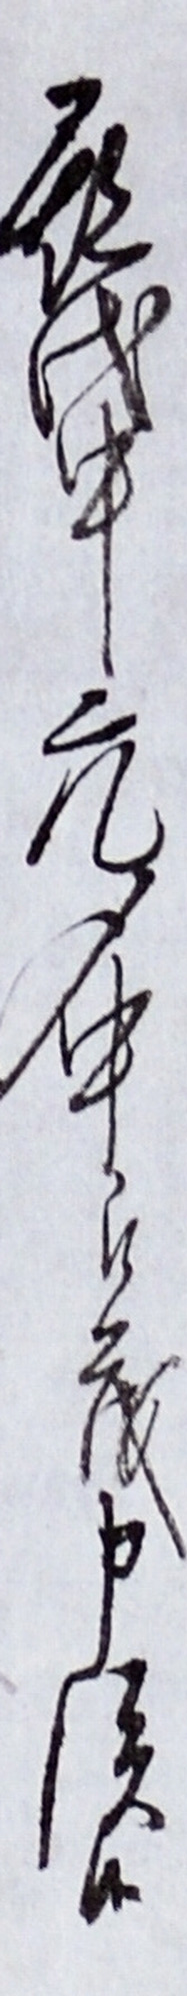郡代中衆〆中江も申談候
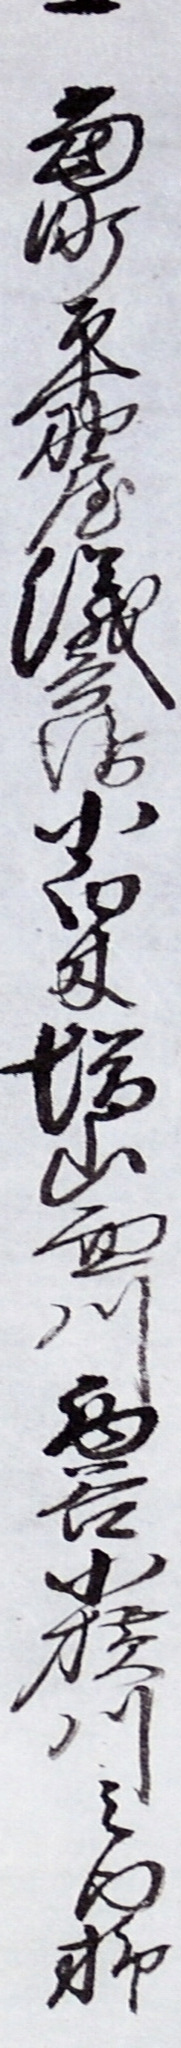一当町東野屋浅兵衛小白木塩山西川西谷小横川之内輪
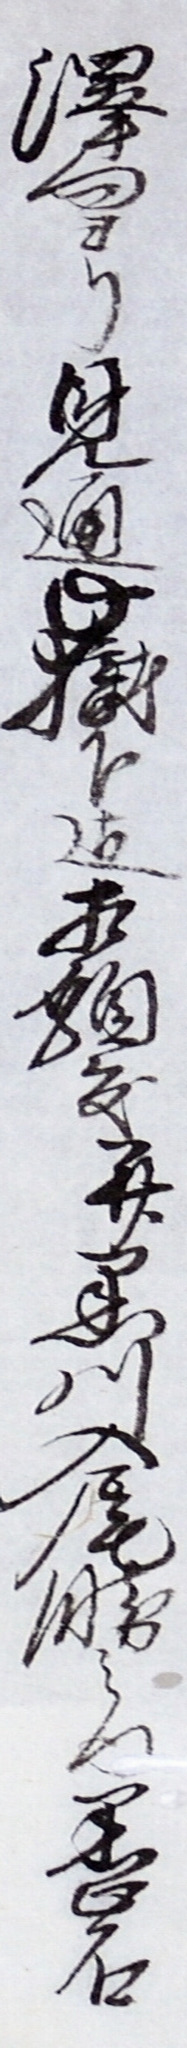沢向ヨリ見通せ掛下迄相願度并黒川入尾勝之内黒四名
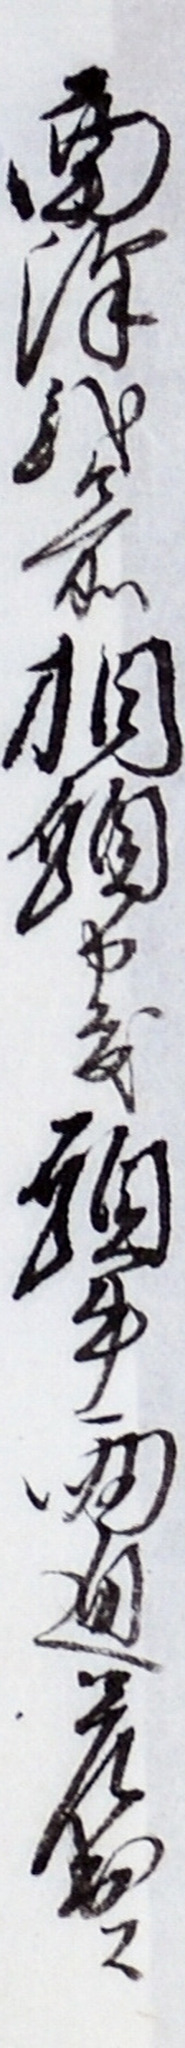南沢弐ケ所相願申度願書両通差出ス
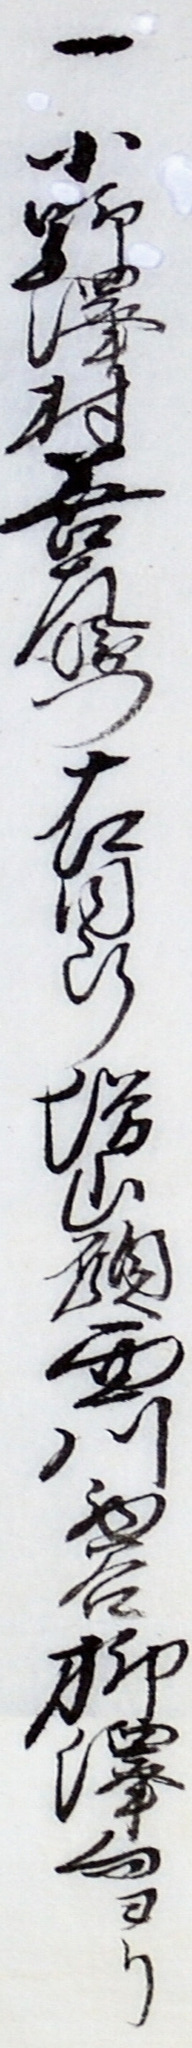一小野沢村善左衛門右同断増山願西川西谷柳沢向ヨリ
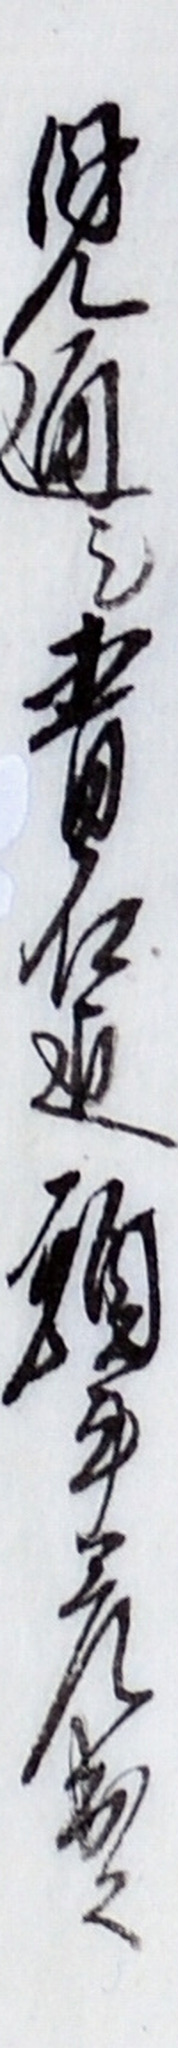見通し青石迄願書差出ス
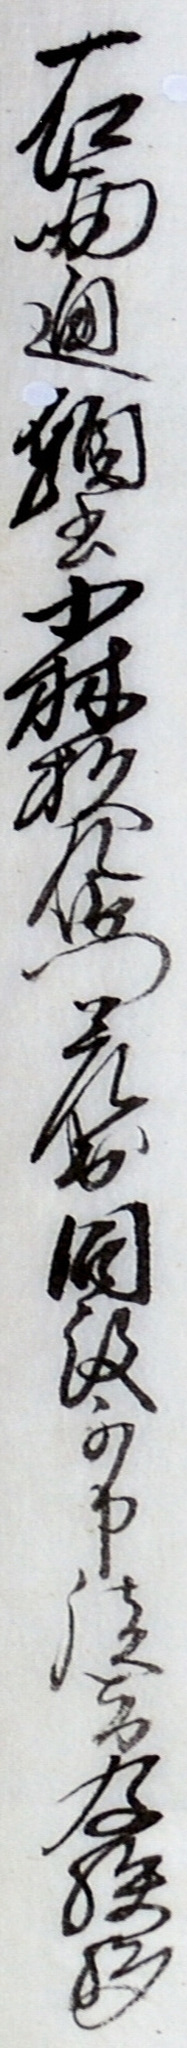右西通願書小林杉左衛門差出同役可申談旨及挨拶
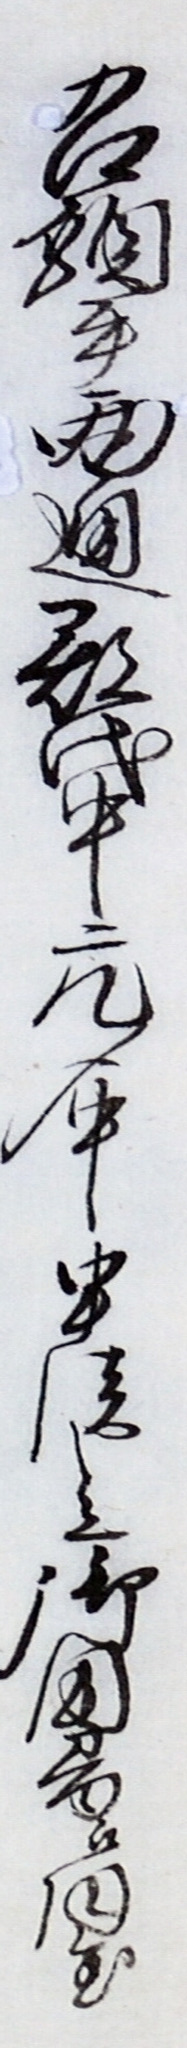右調書西通郡代中元〆中申談之上御用番江伺置
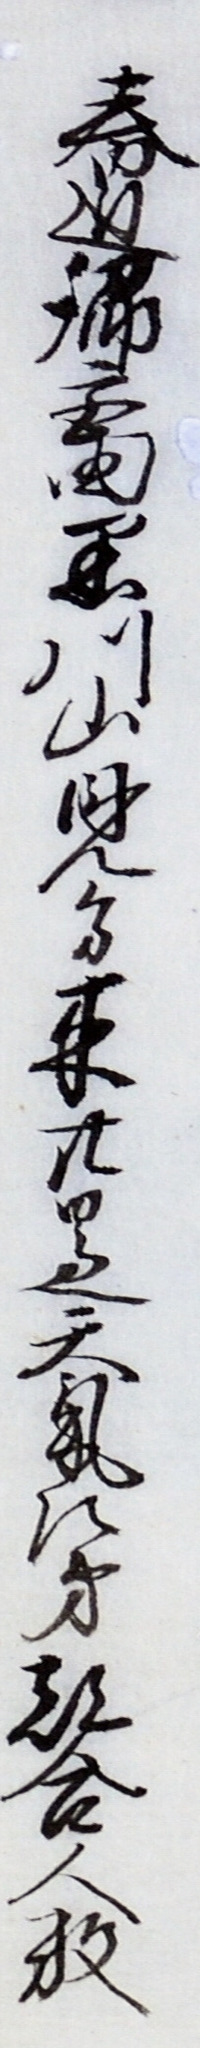一春辺郷宮田黒川山児方来廿日迄天気次第都合人数
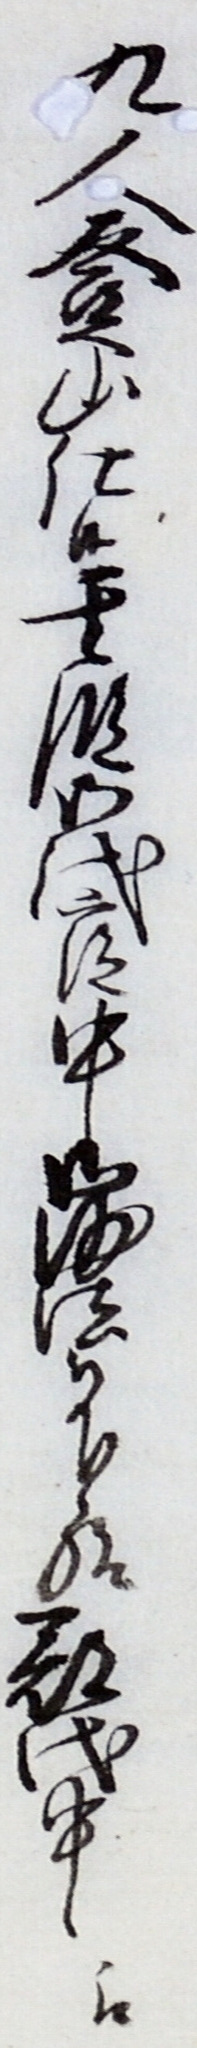九人登山仕候其段御代官中御渡法被下候様郡代中江
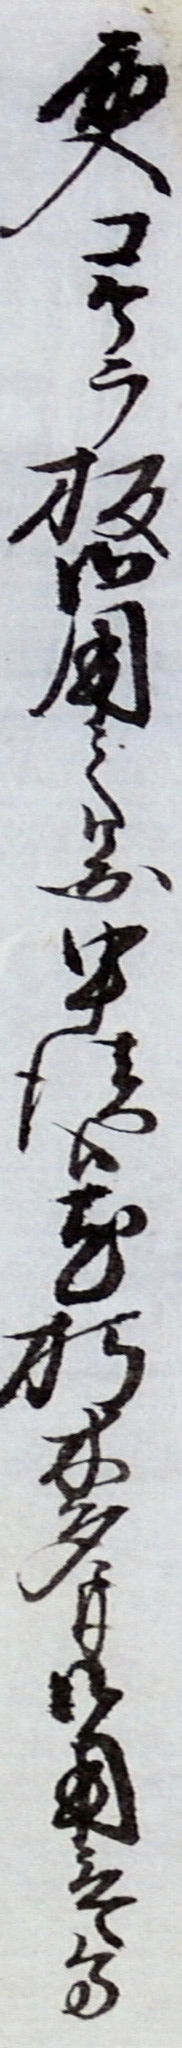届入コケラ板御用之図申談候尤朽木多き御用立之方
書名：御山奉行御用控
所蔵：伊那市立高遠町図書館・合同会社AMANE
